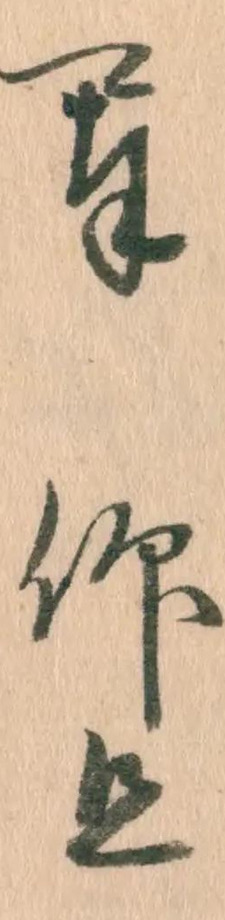可奉仰且
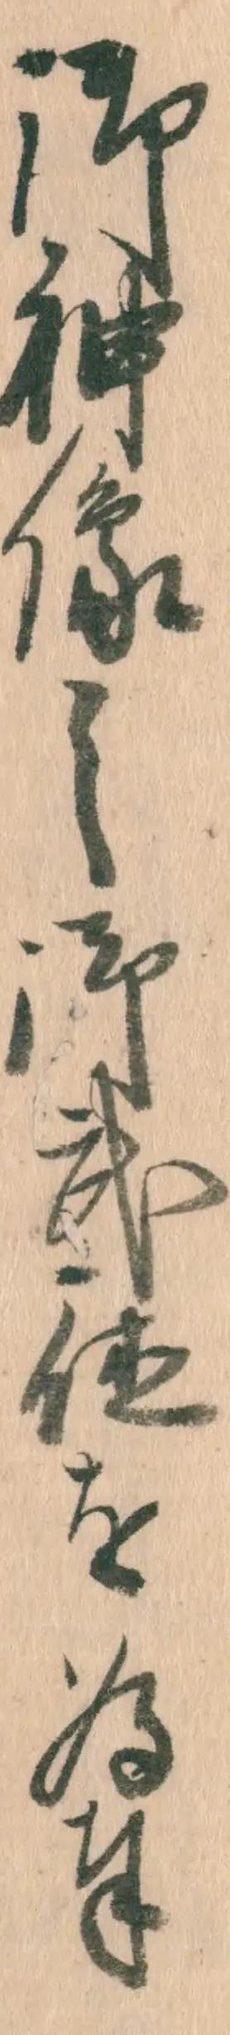御神像之御武徳を為奉

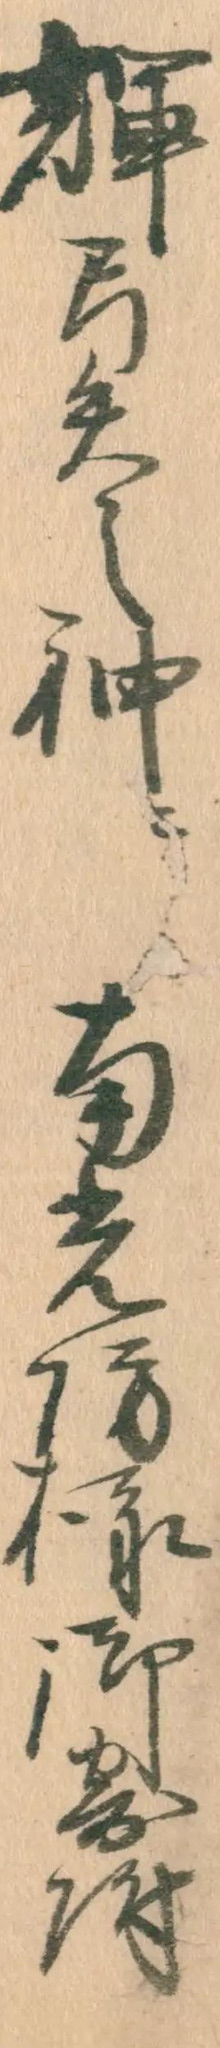輝弓矢之神に南光坊様御寄附
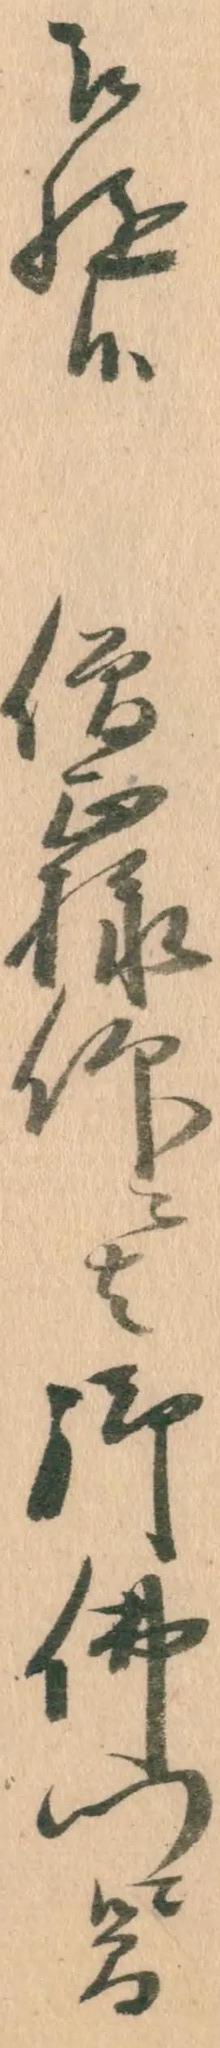被遊候僧正様仰には御仏門に候而
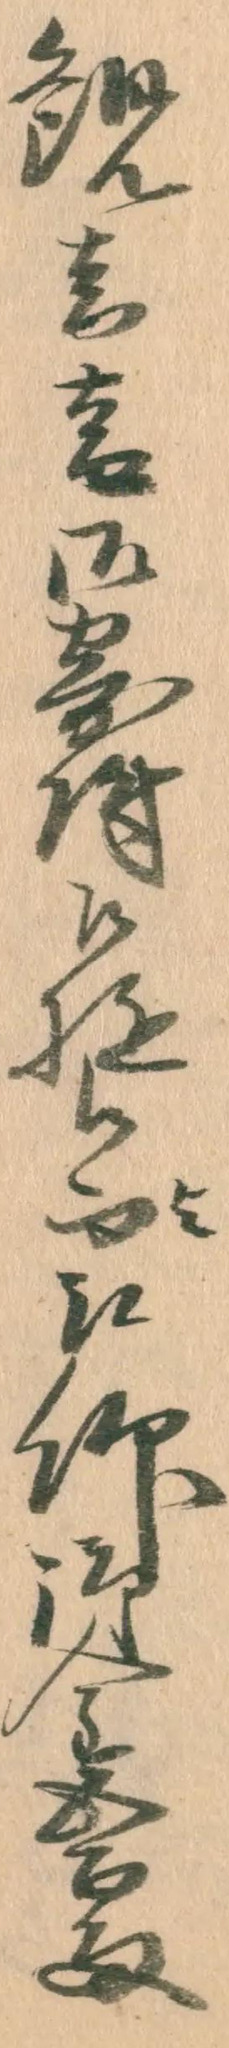観音台御寄附被遊候而と被仰御金五百両
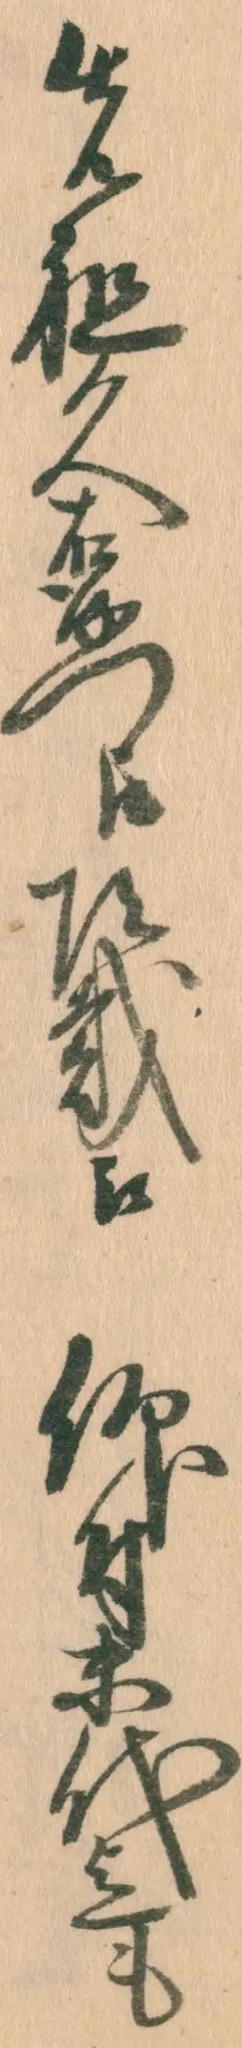先祖久右衛門え頂戴被仰付末代迄も
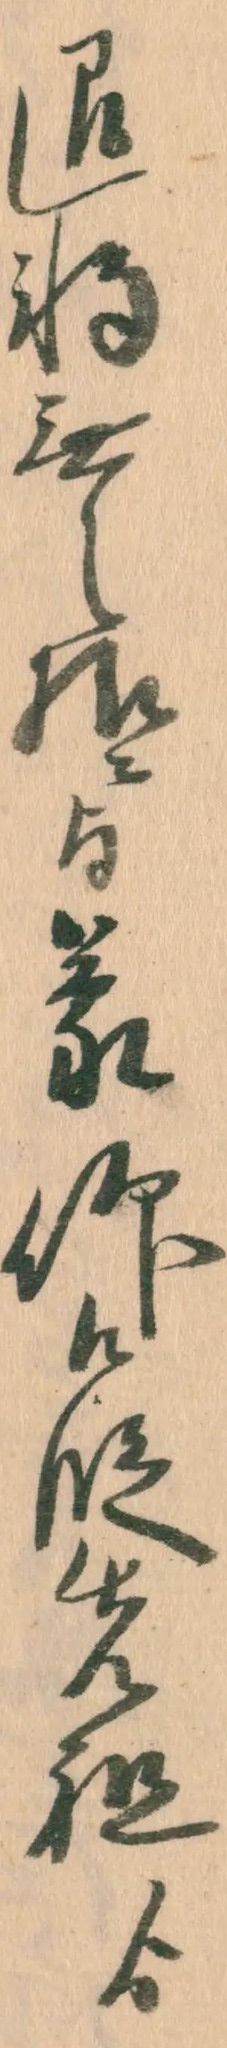退転無之様にと蒙仰候段先祖ゟ
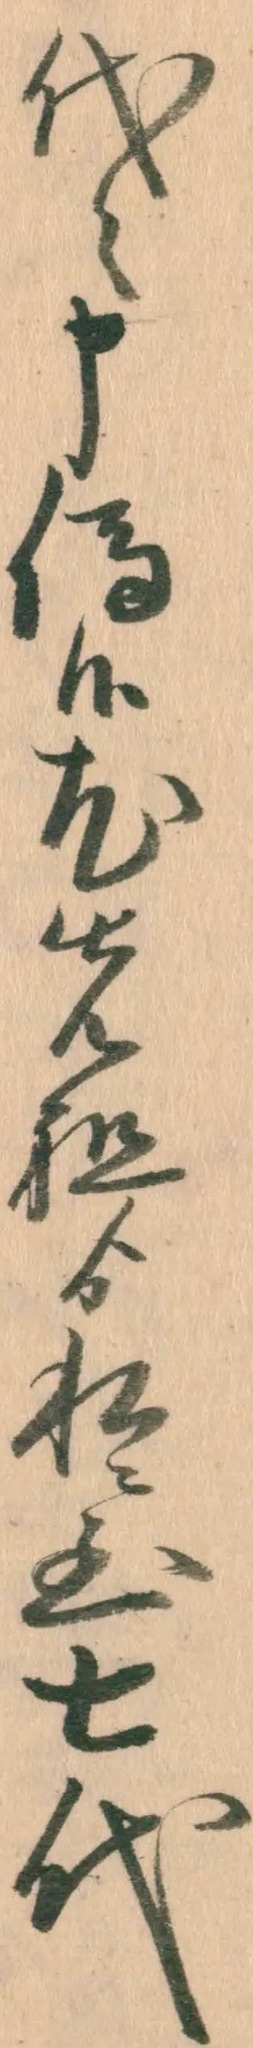代々申伝候尤先祖ゟ私に至七代
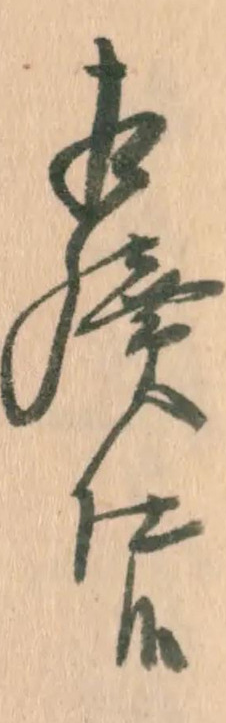相続仕候
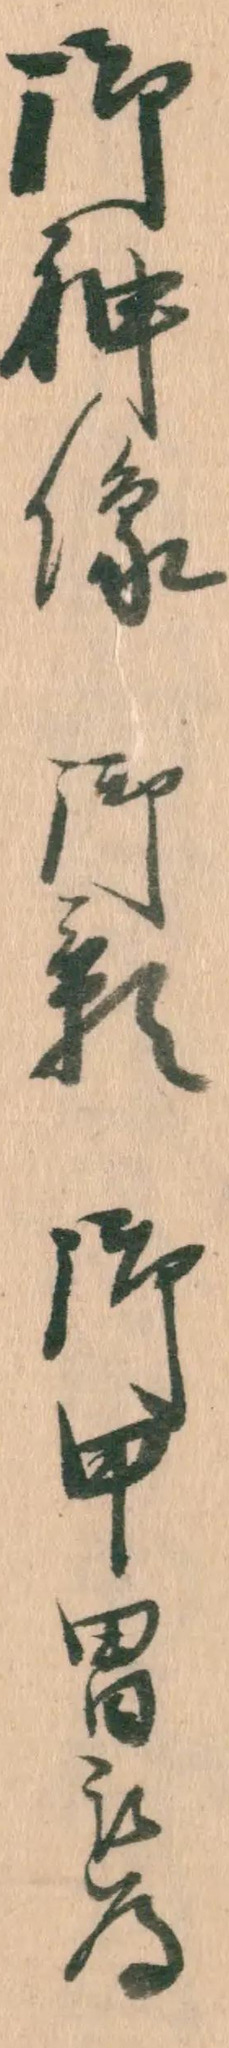御神像御影御甲冑被為
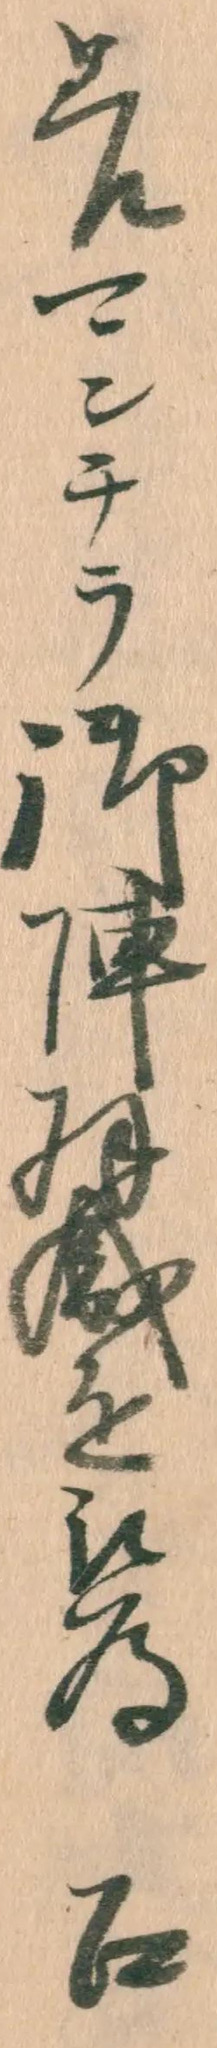着マンチラ御陣羽織を被為召
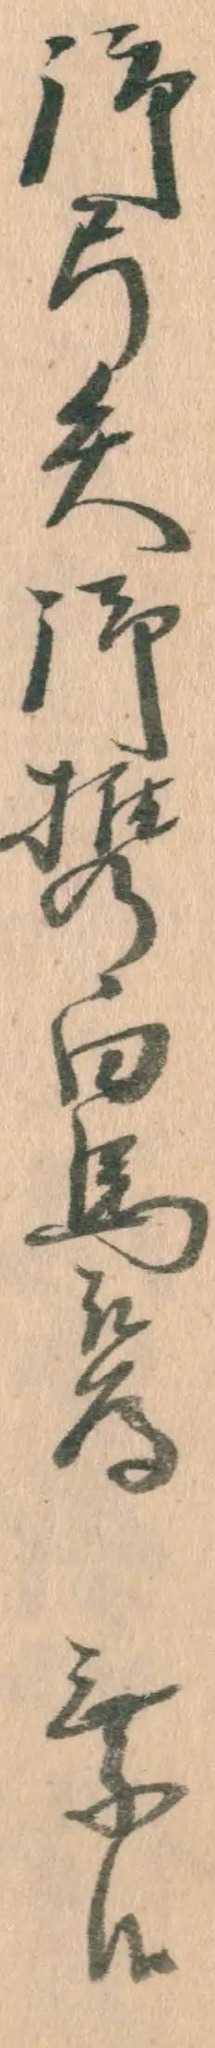御弓矢御携白馬被為乗候
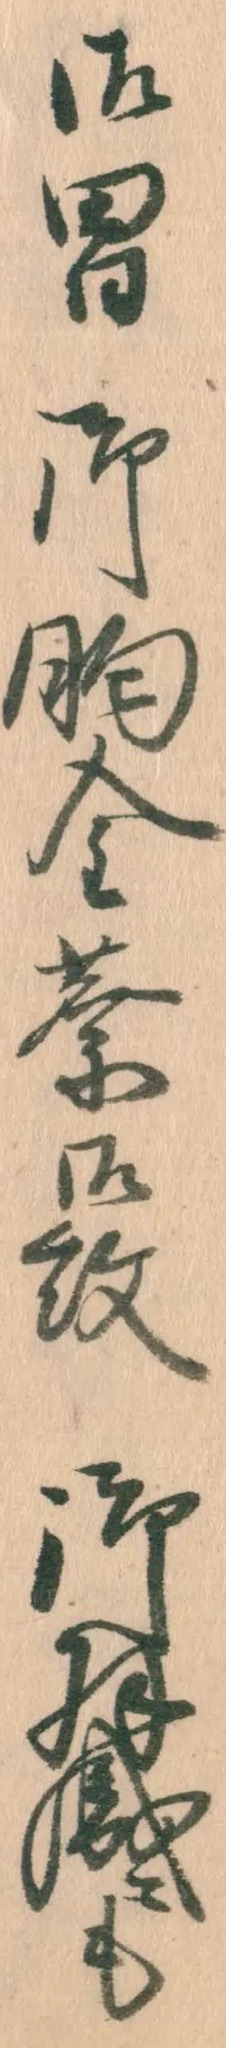御冑御胸金葵御紋御羽織にも
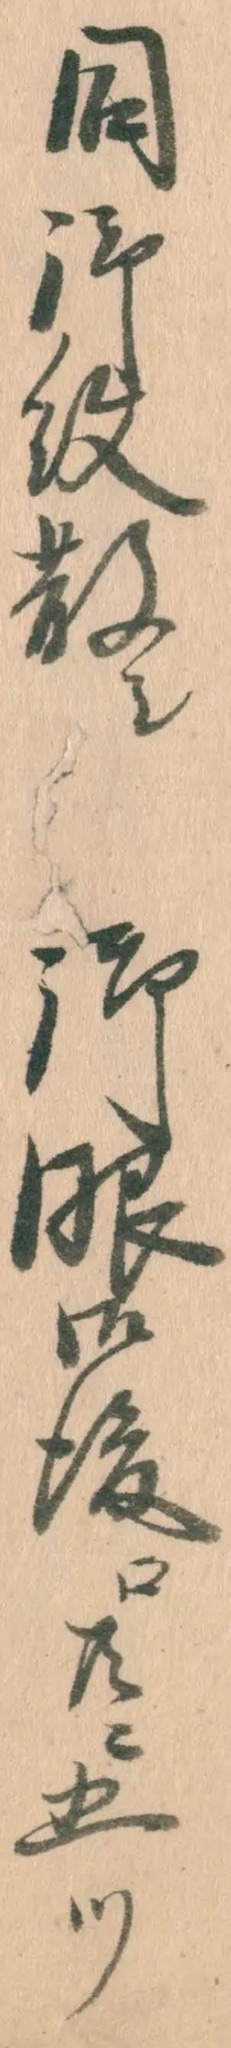同御紋散し御服御後ろ共に五つ

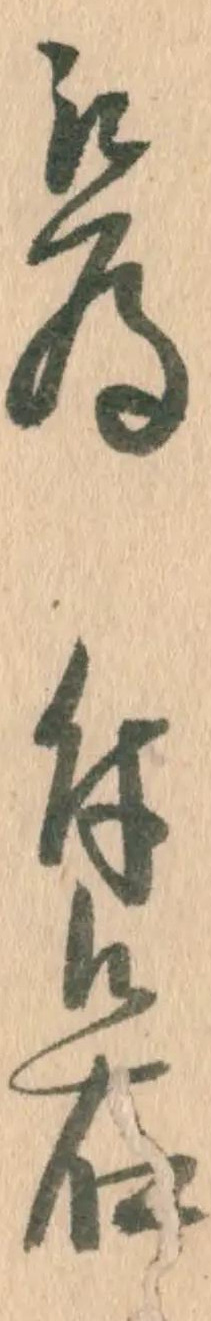被為付候右
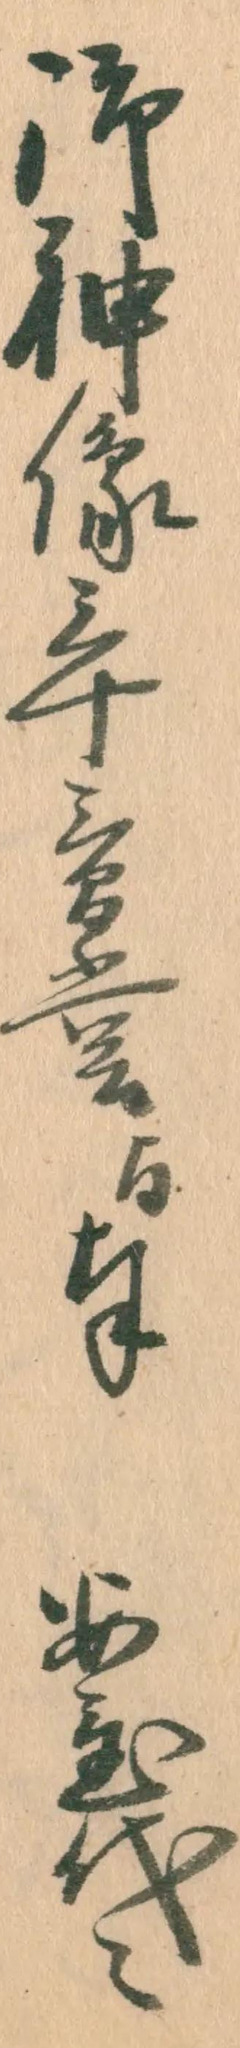御神像三十三間堂え奉安置代々
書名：三十三間堂. [1]
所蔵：国立国会図書館 National Diet Library, JAPAN
